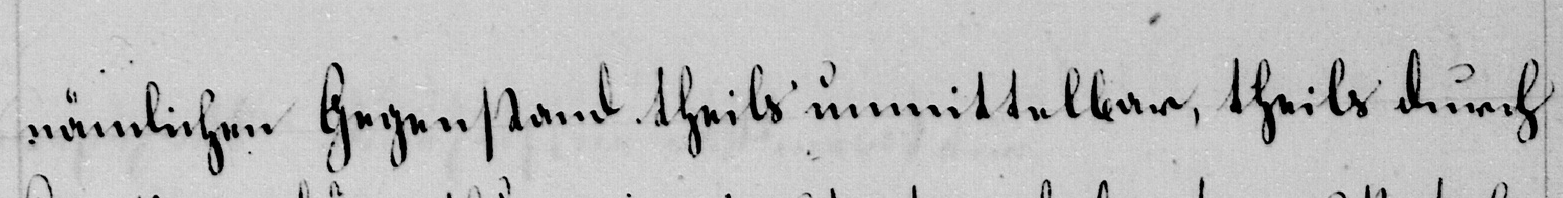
nähmlichen Gegenstand theils unmittelbar, theils durch
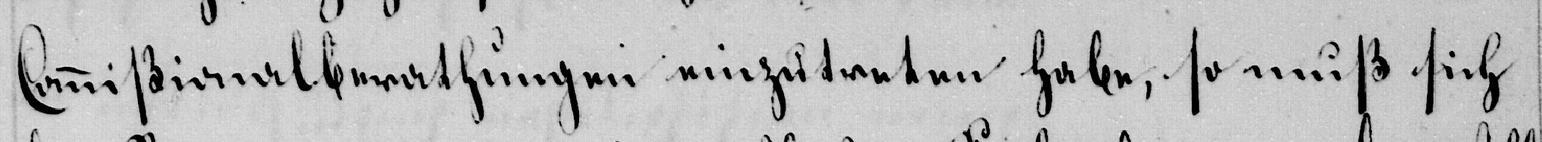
Comißionalberathungen einzutreten habe, so muß sich
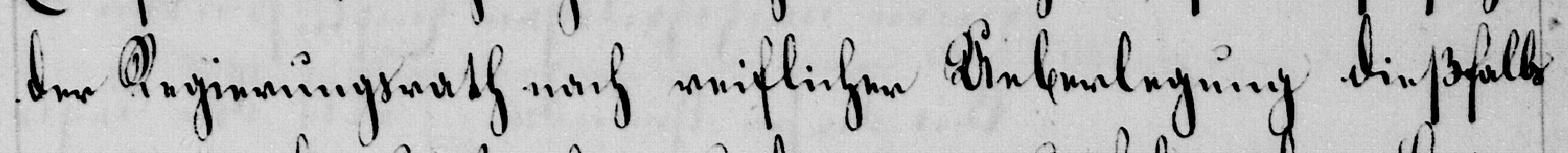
der Regierungsrath nach reiflicher Ueberlegung dießfalls
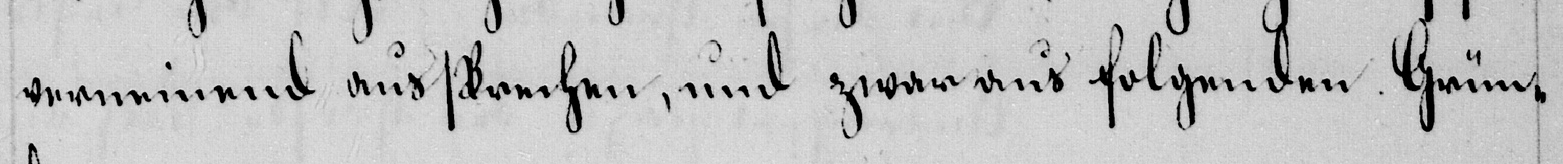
verneinend aussprechen, und zwar aus folgenden Grün¬
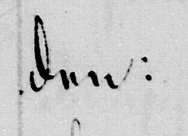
den:
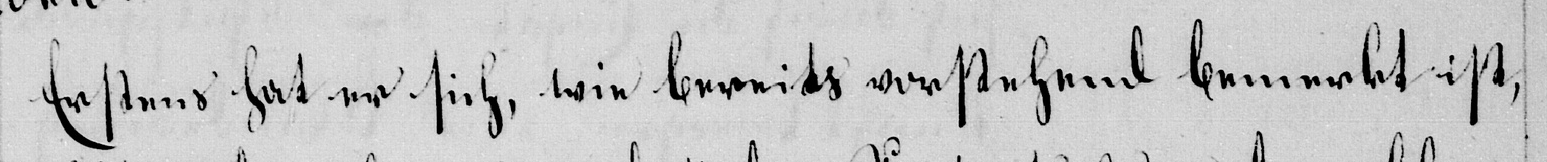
Erstens hat er sich, wie bereits vorstehend bemerkt ist,
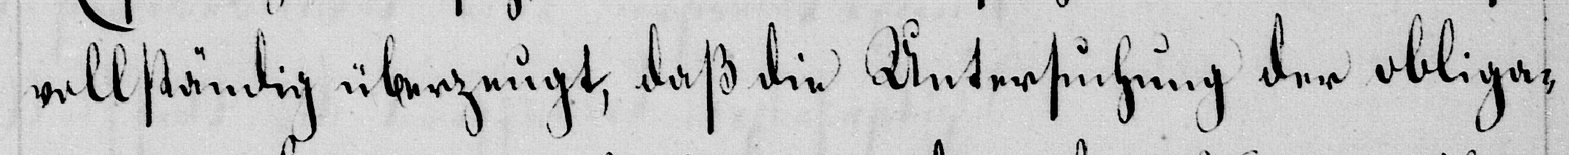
vollständig überzeugt, daß die Unterstützung der obliga¬
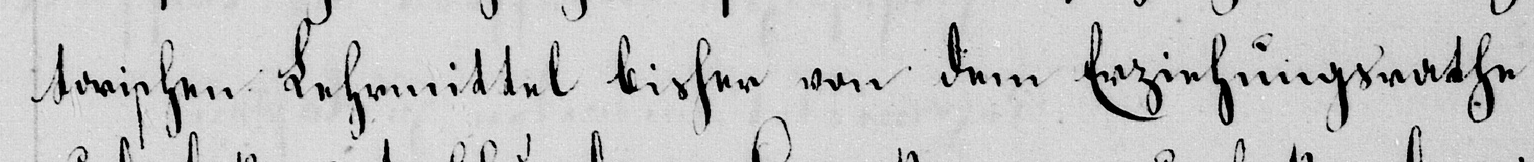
torischen Lehrmittel bisher von dem Erziehungsrathe
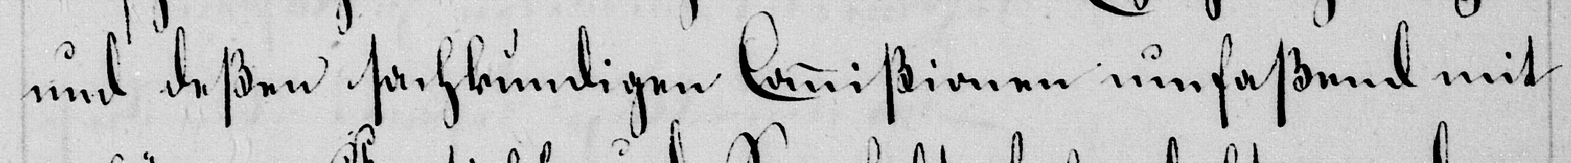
und deßen sachkundigen Commißionen umfaßend mit
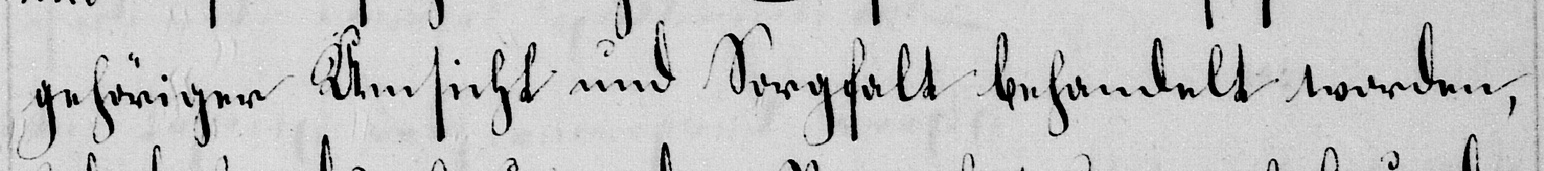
gehöriger Umsicht und Sorgfalt behandelt worden,
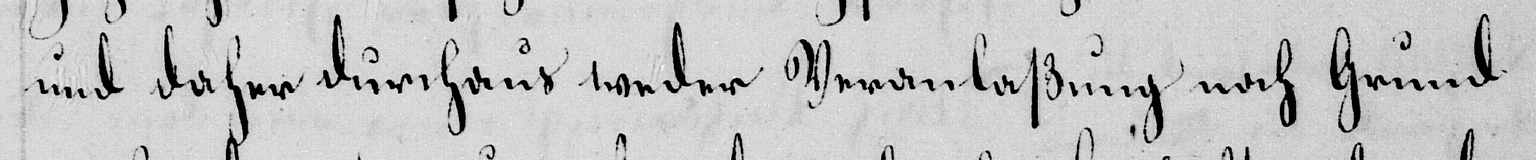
und daher durchaus weder Veranlaßung noch Grund
